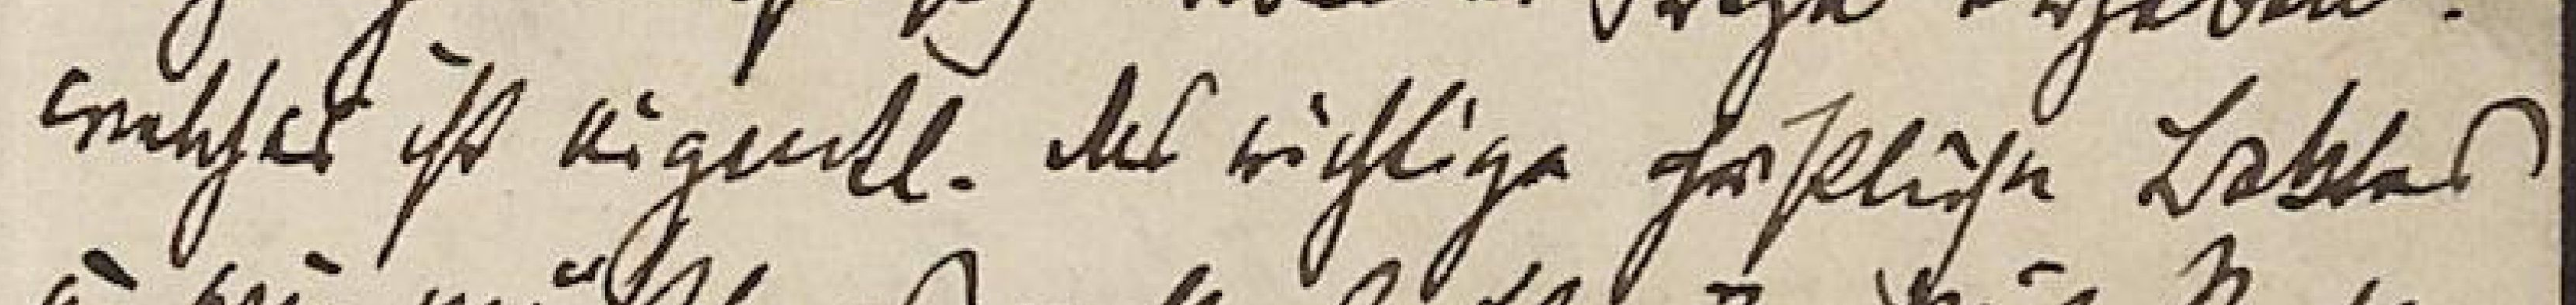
welches ist eigentl. das richtige christliche Bektns
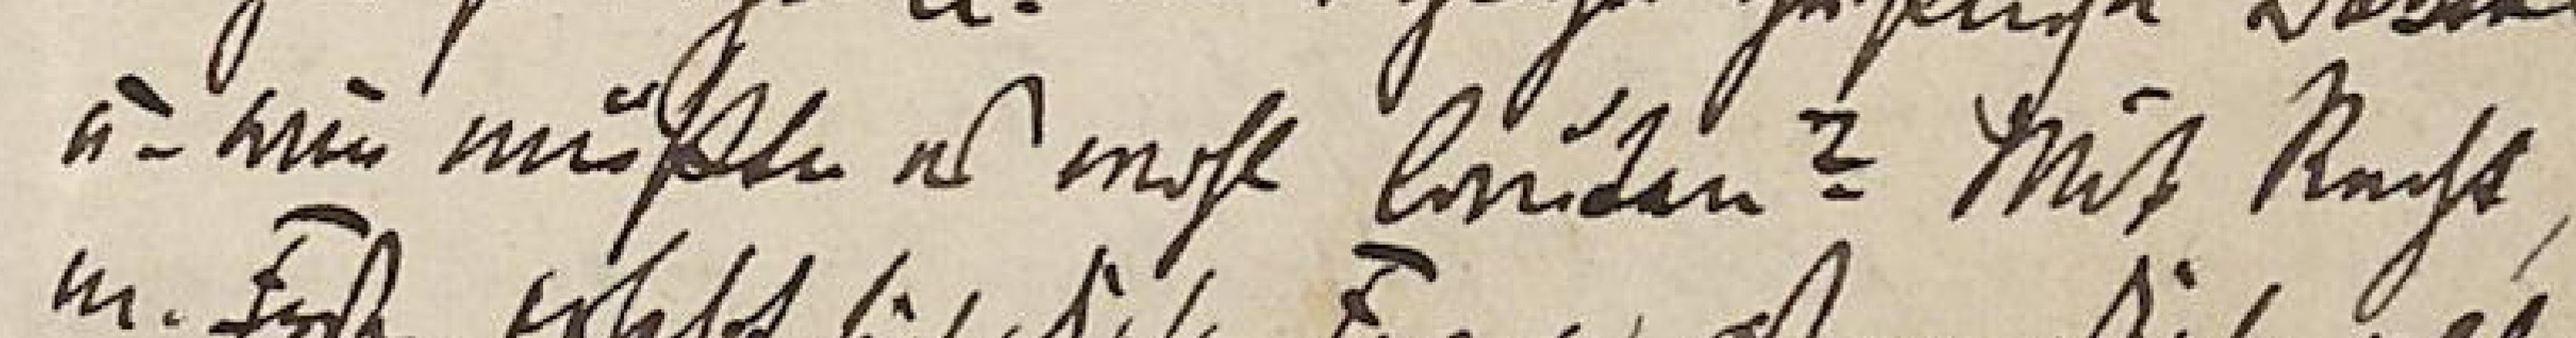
u wie müßte es wohl lauten? Mit Recht,
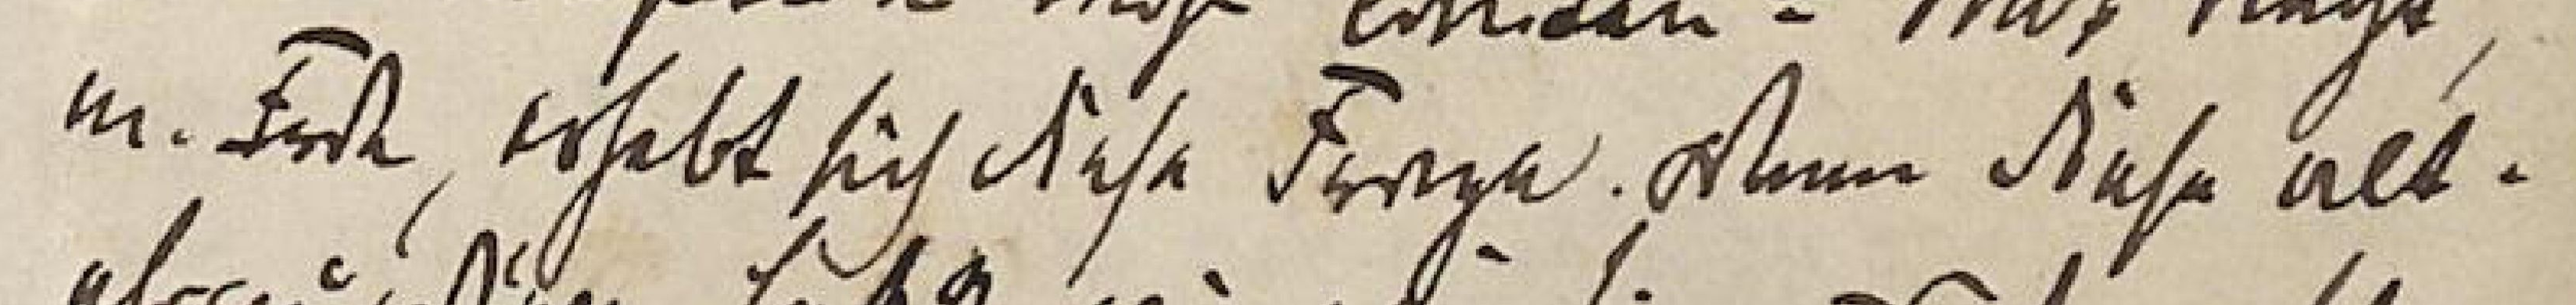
m. Frde, erhebt sich dies Frage. Denn diese alt¬
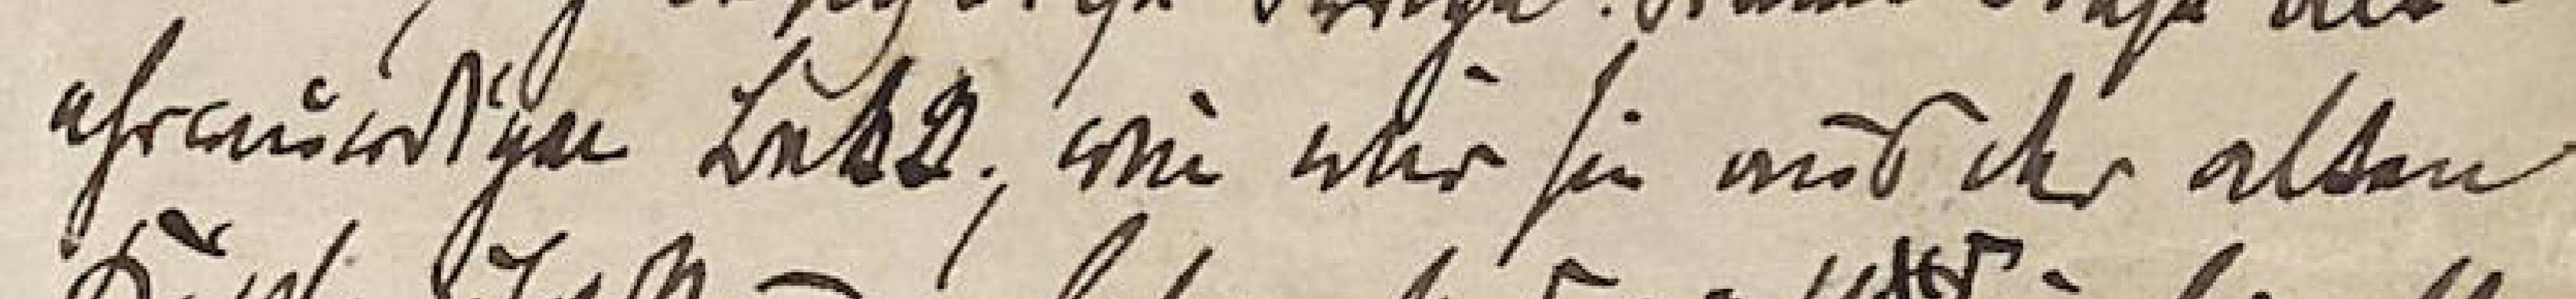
ehrwürdigen Bekk, wie wir sie aus der alten
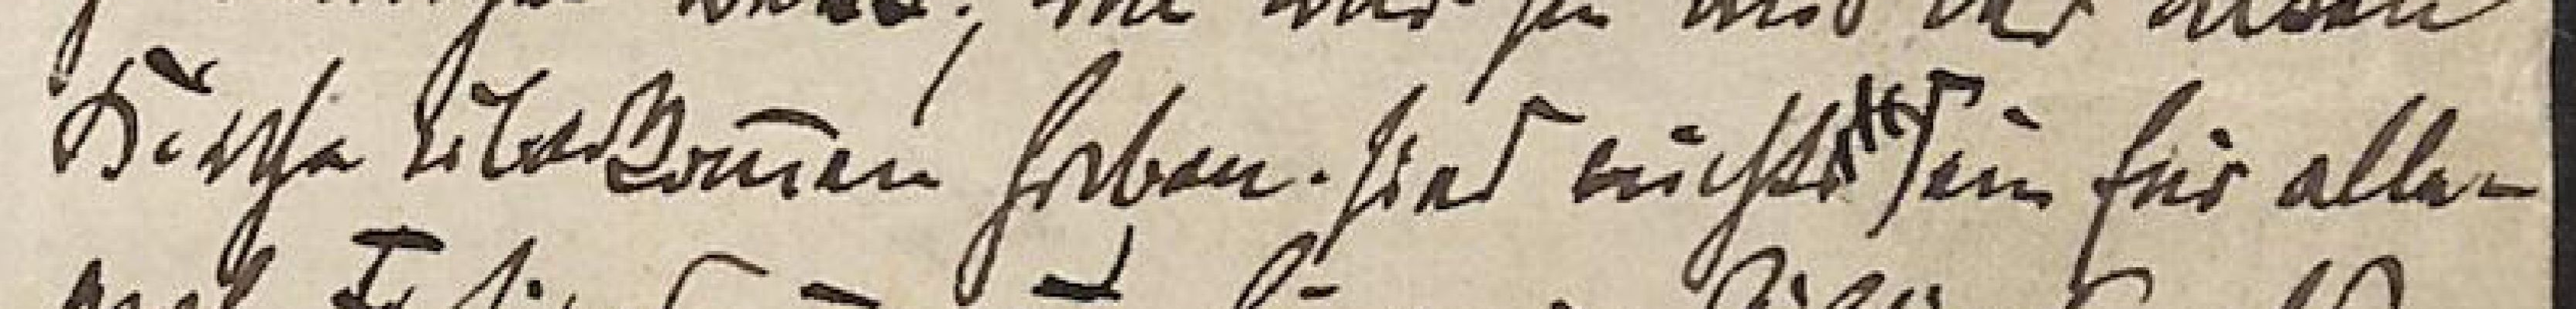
Kirche überkomen haben, sind nichts [ ein für alle¬
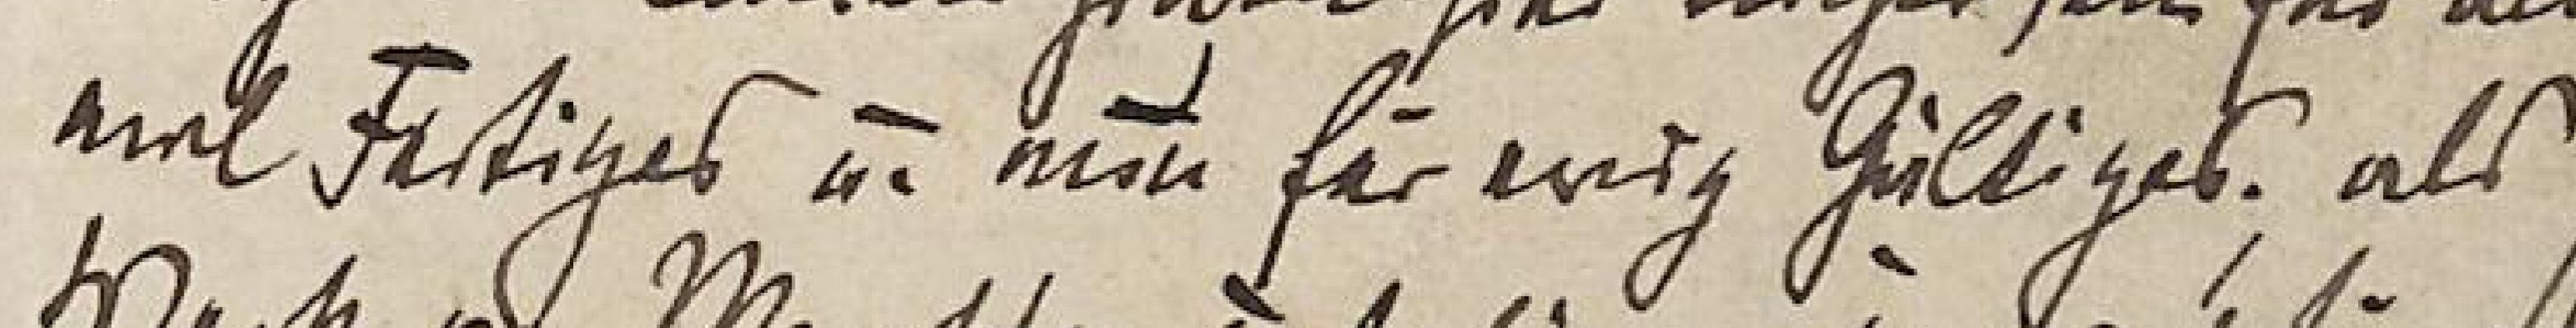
mal Fertiges u. nun für ewig Gültiges. als
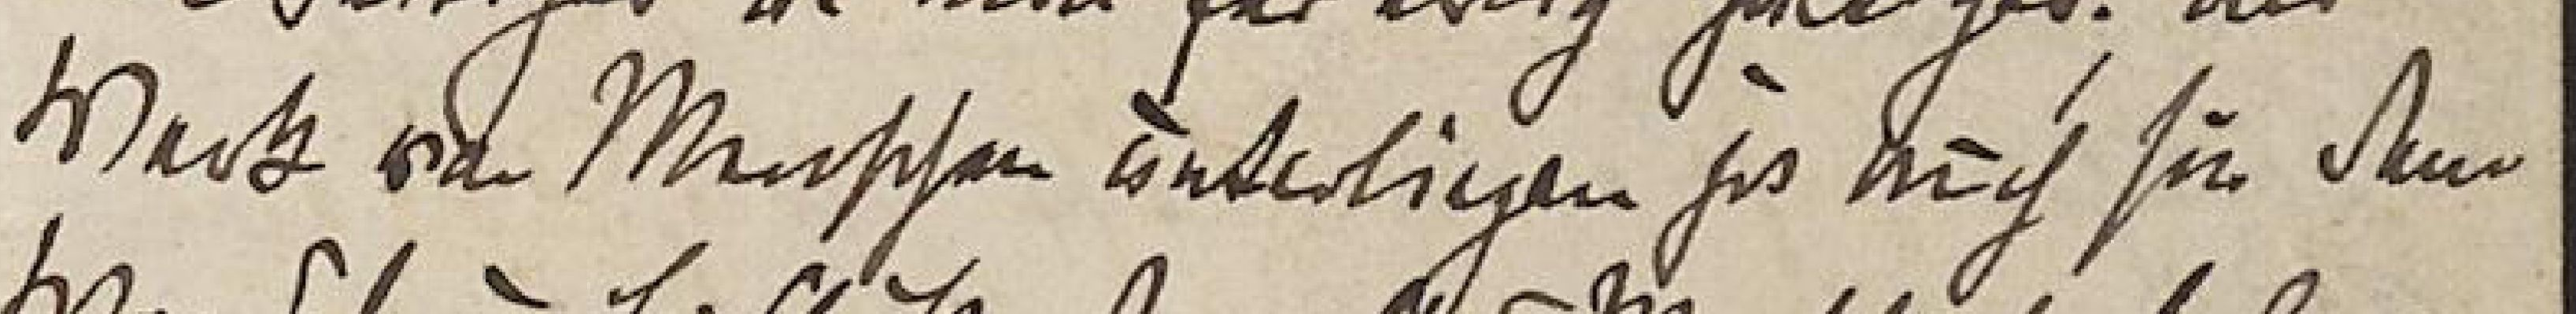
Werk von Menschen unterliegen ja auch sie dem
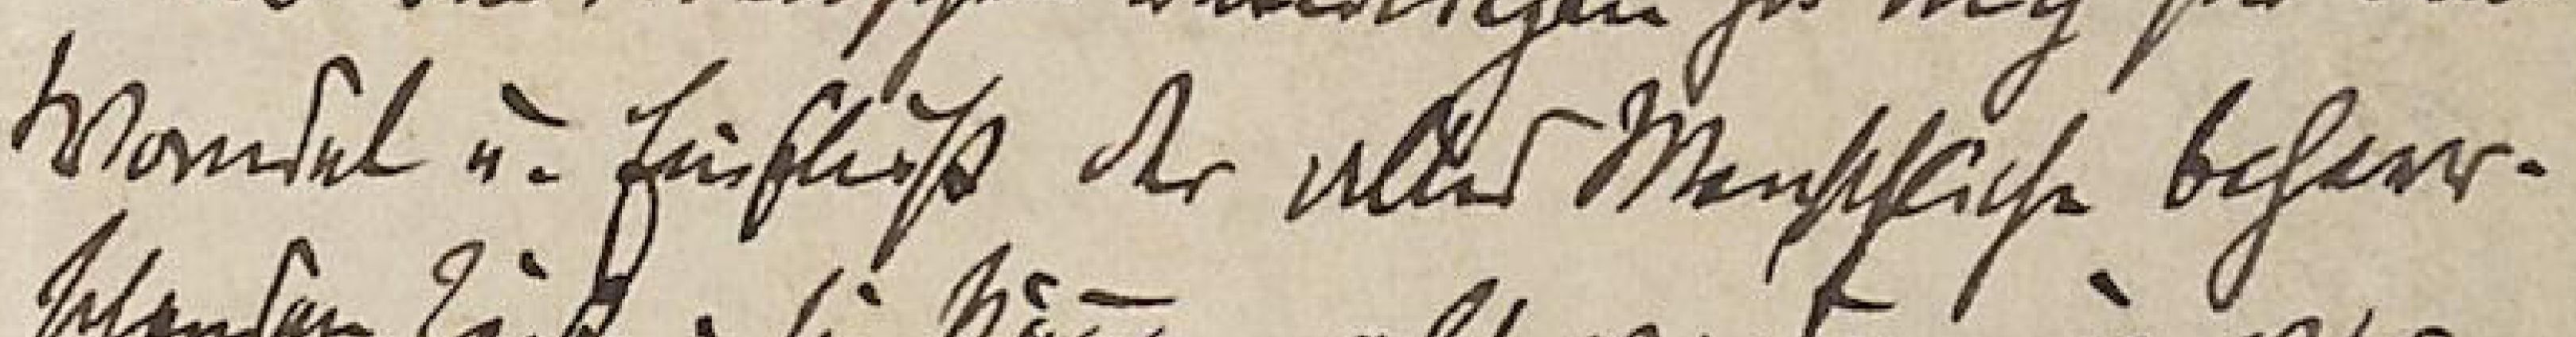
Wandel u. Einfluß der alles Menschliche beherr¬
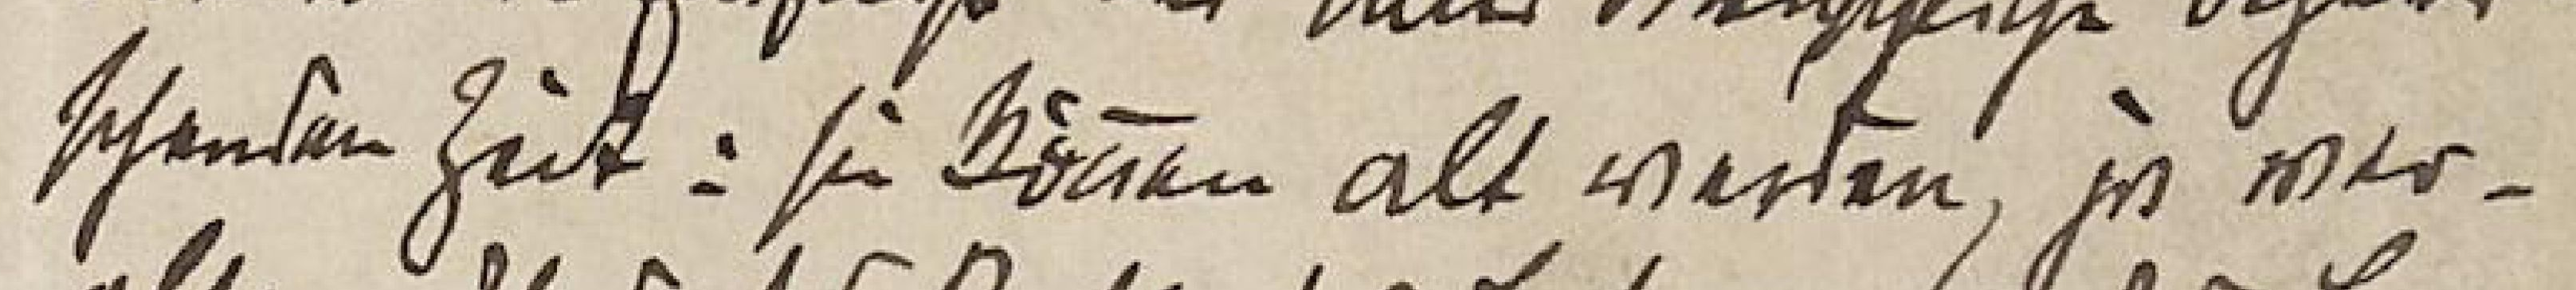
schenden Zeit: sie könen alt werden, ja ver¬
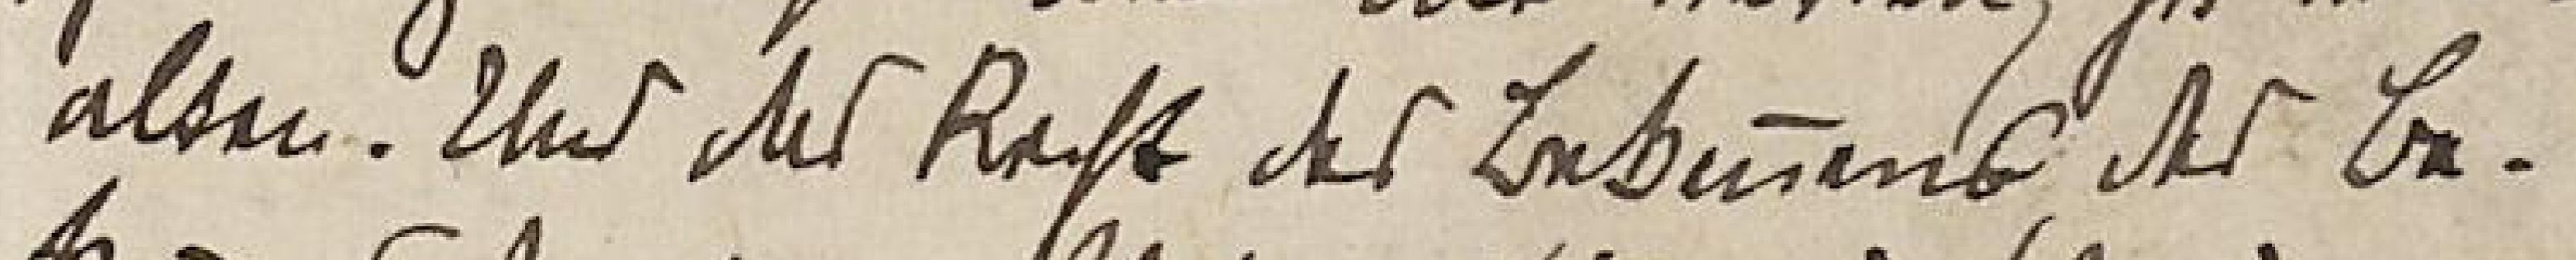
alten. Und das Recht des Bekenens des Be¬
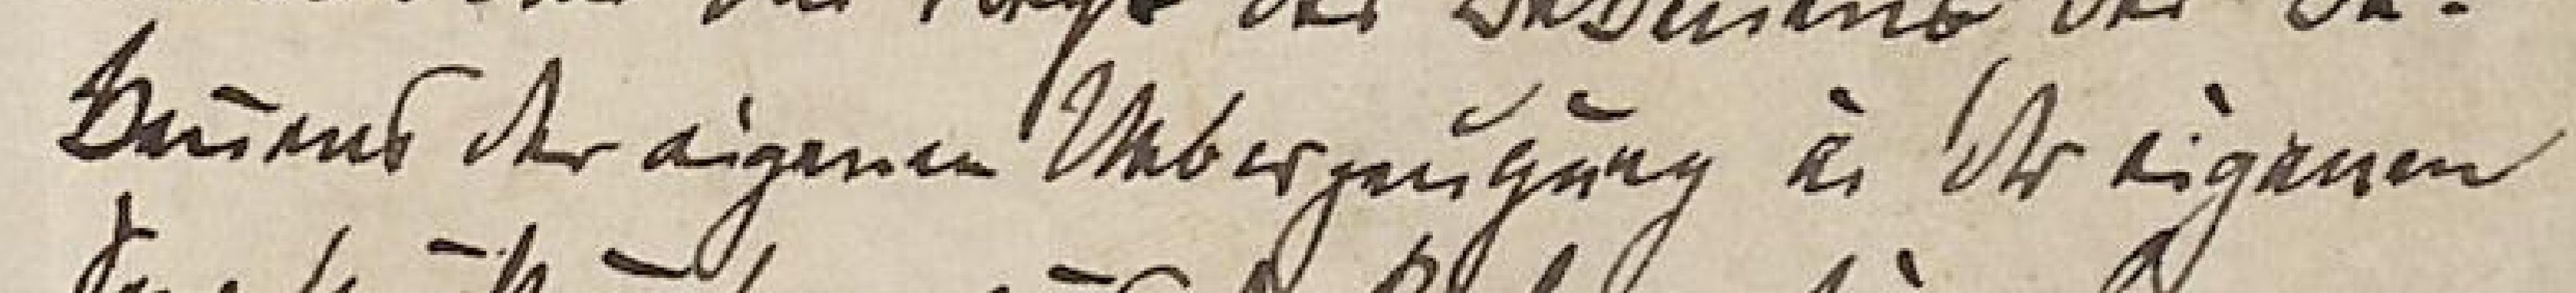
kenens der eigenen Ueberzeugung in der eigenen
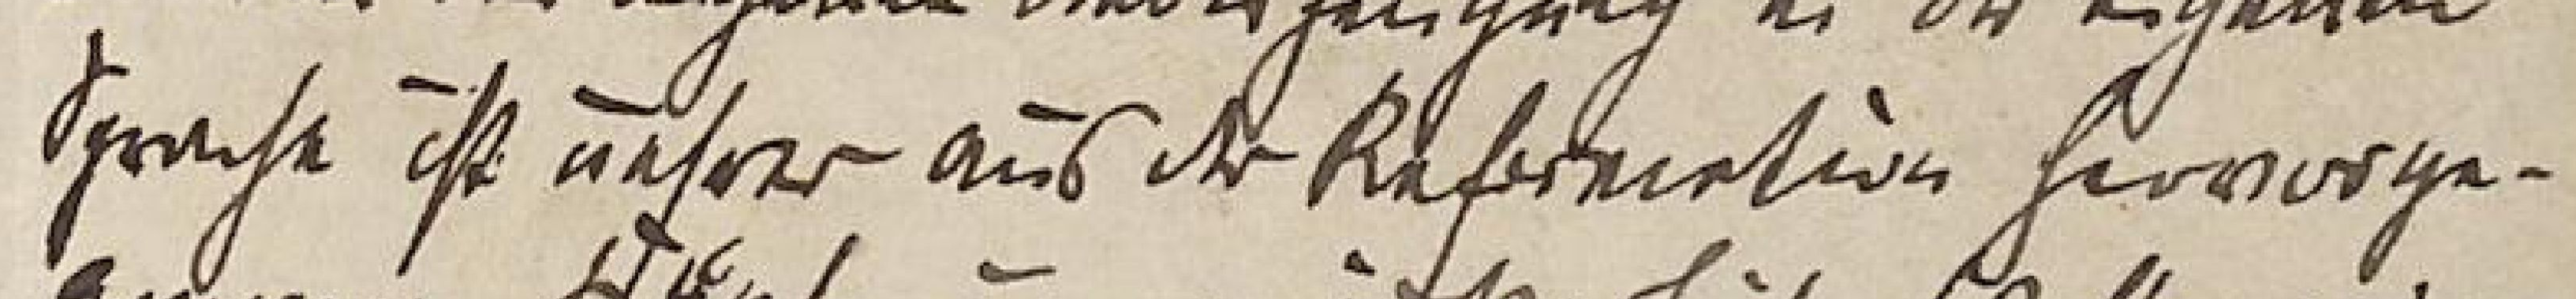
Sprache ist unser aus der Reformation hervorge¬
